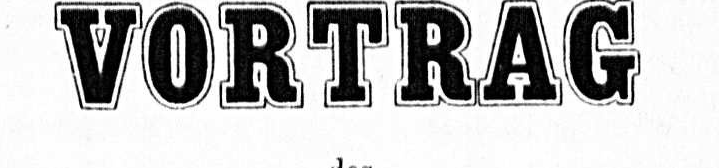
VORTRAG
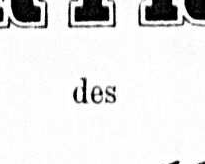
des
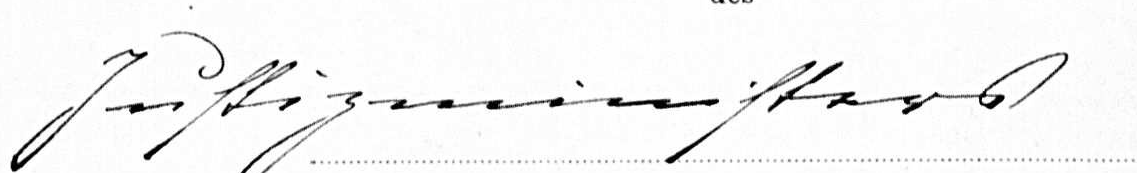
Justizministers
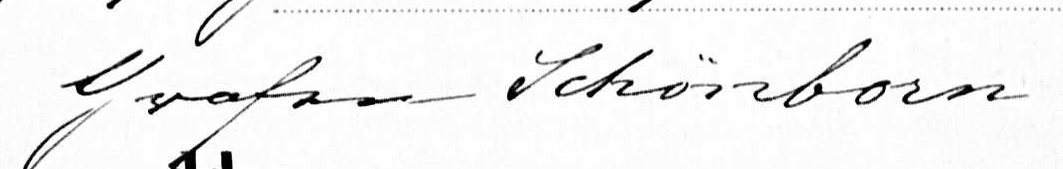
Grafen Schönborn
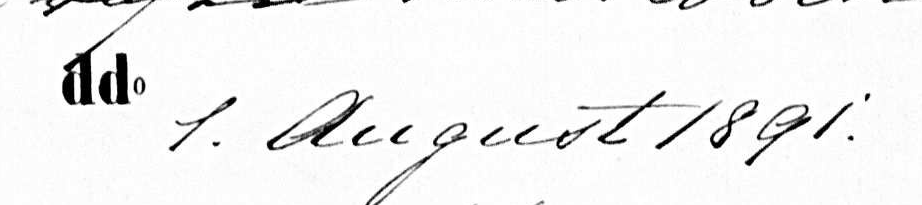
ddo 1. August 1891
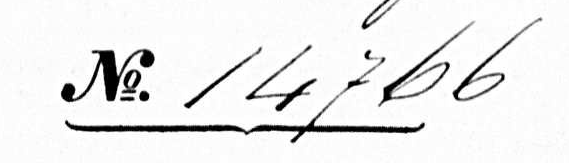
No. 14766
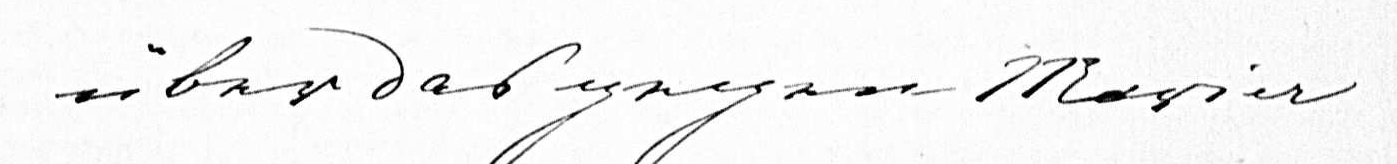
Über das gegen Maria
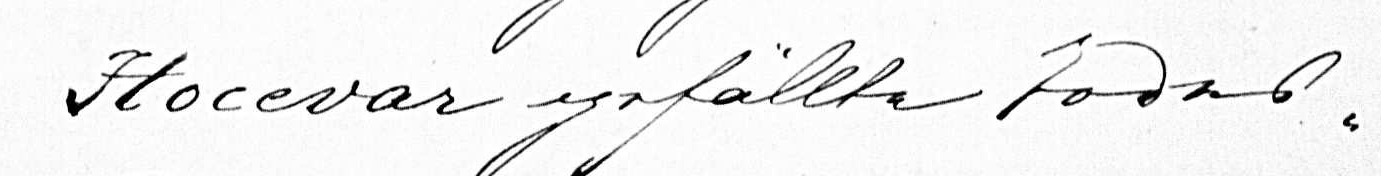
Hocevar gefällte Todes¬
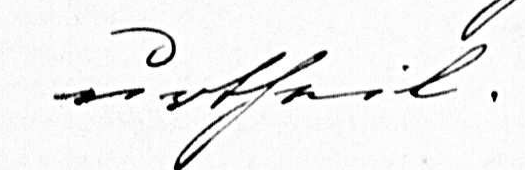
urtheil.
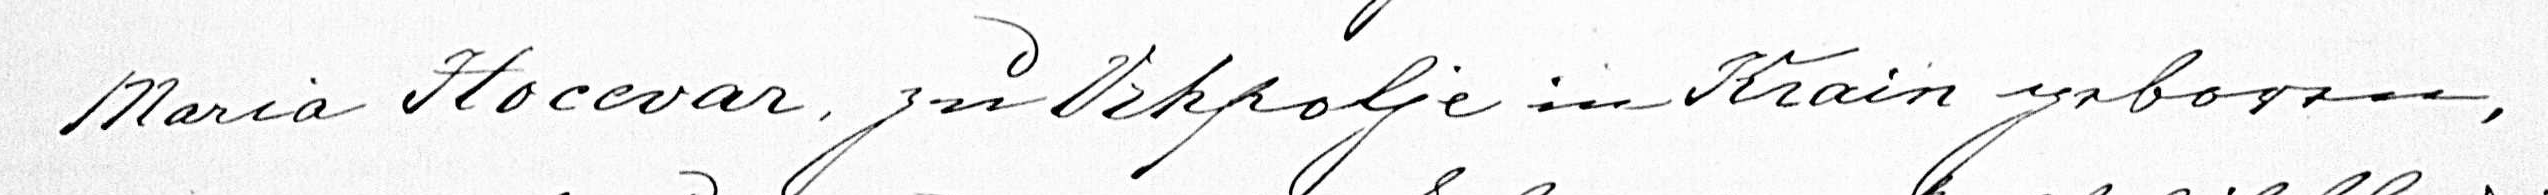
Maria Hocevar, zu Vrhpolje in Krain geboren,
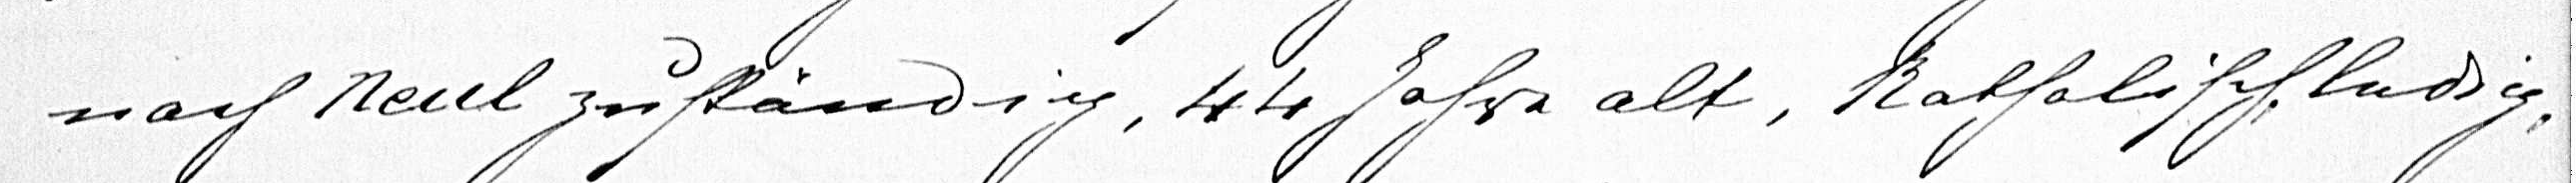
nach Neul zuständig, 44 Jahre alt, katholisch, ledig,
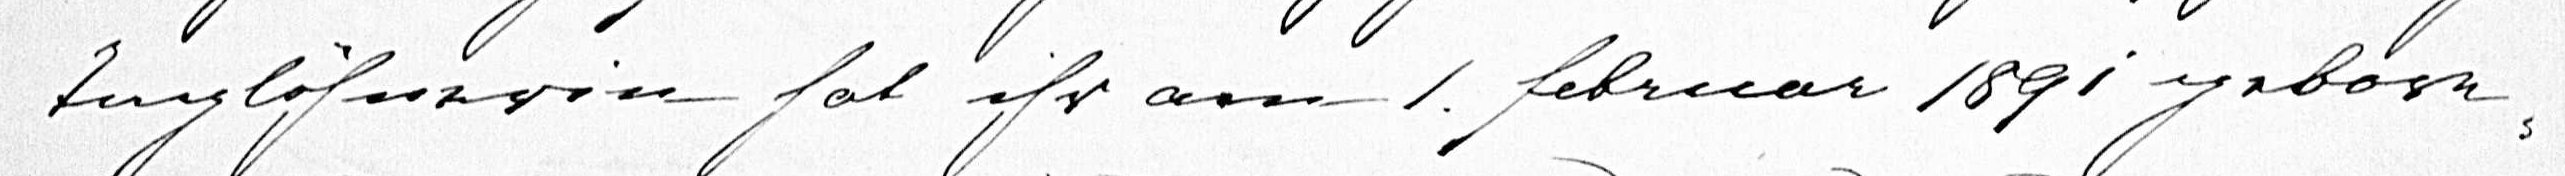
Taglöhnerin hat ihr am 1. Februar 1891 gebore¬
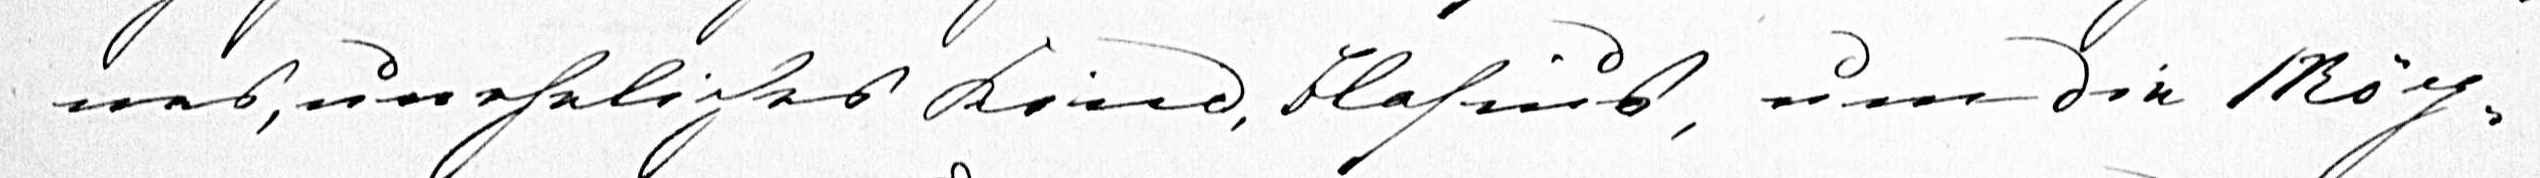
nes, uneheliches Kind, Blasius, um die Mög¬
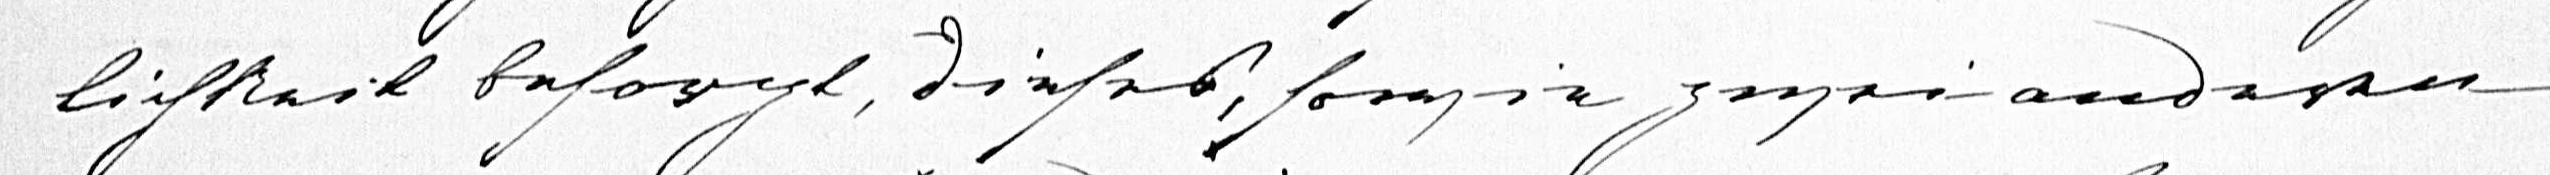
lichkeit besorgt, dieses, sowie zwei anderen
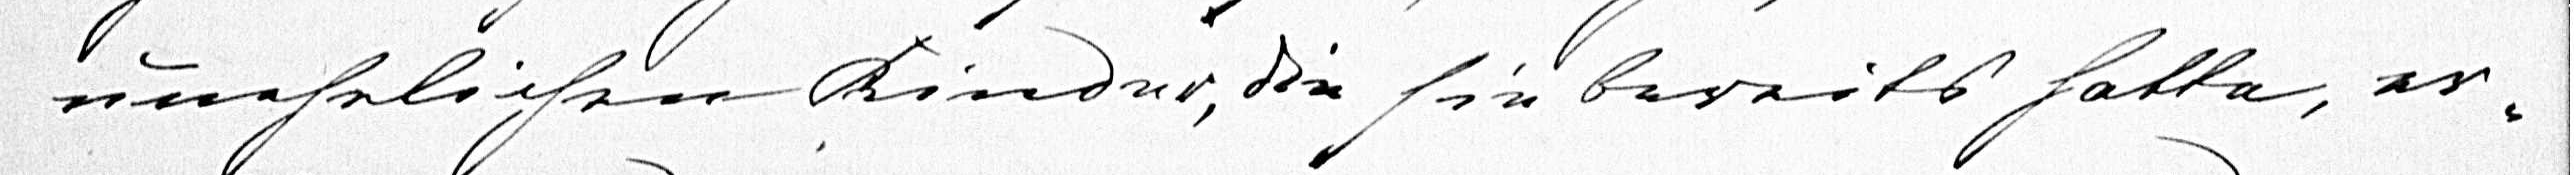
unehelichen Kinder, die sie bereits hatte, er¬
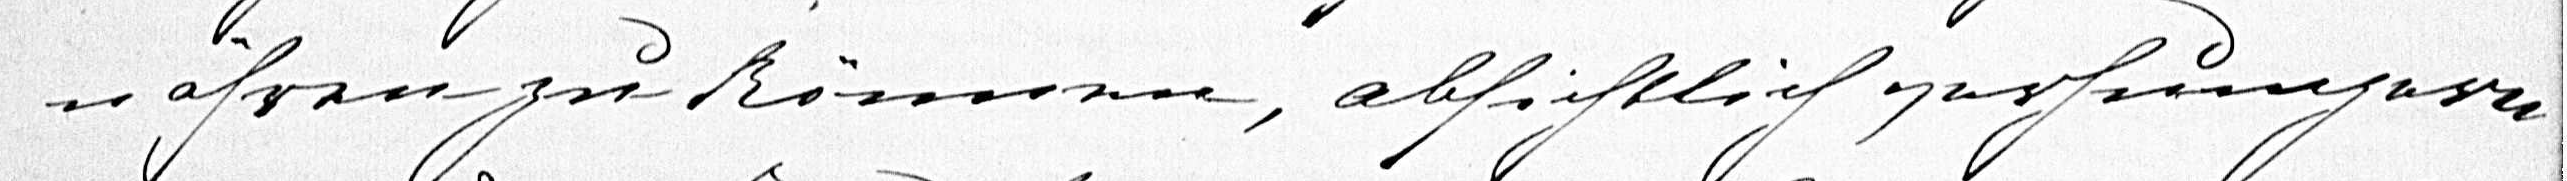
nähren zu können, absichtlich verhungern
